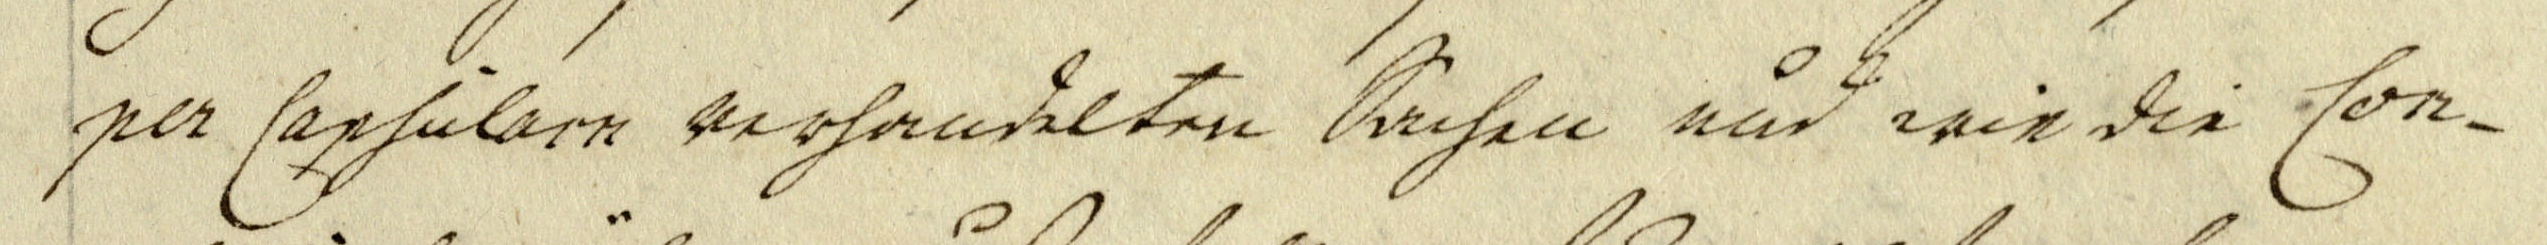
per Capsulam verhandelten Sachen und wie die Con¬
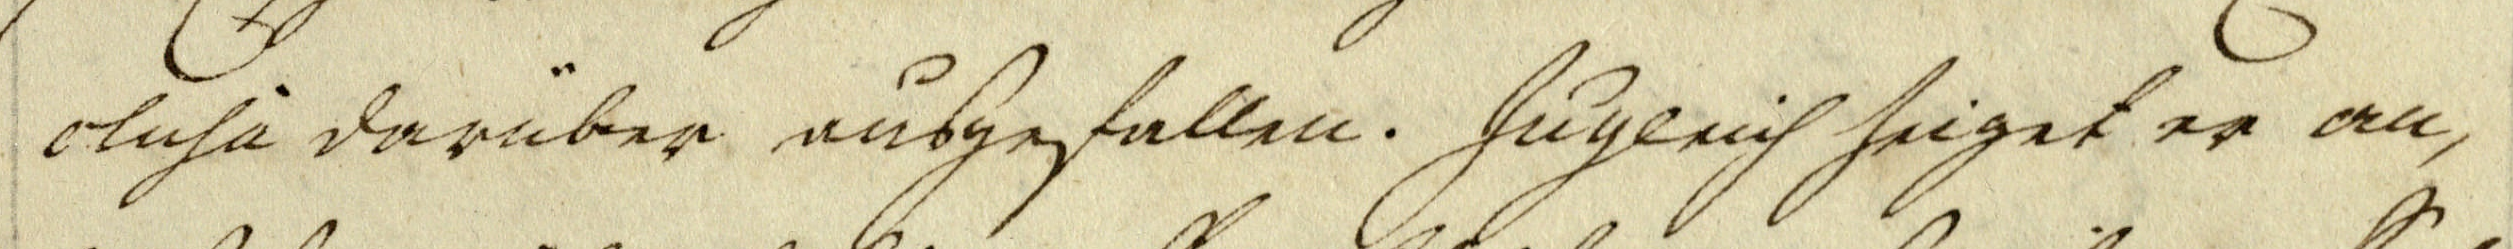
clusa darüber ausgefallen. Zugleich zeiget er an,
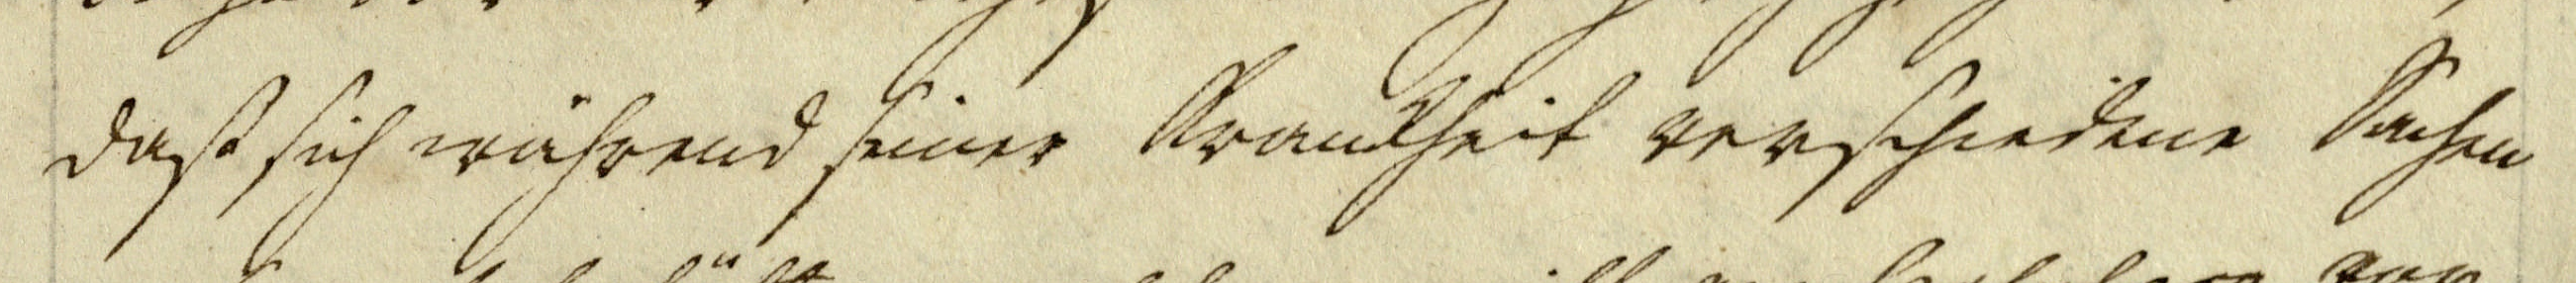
daß sich während seiner Krankheit verschiedene Sachen
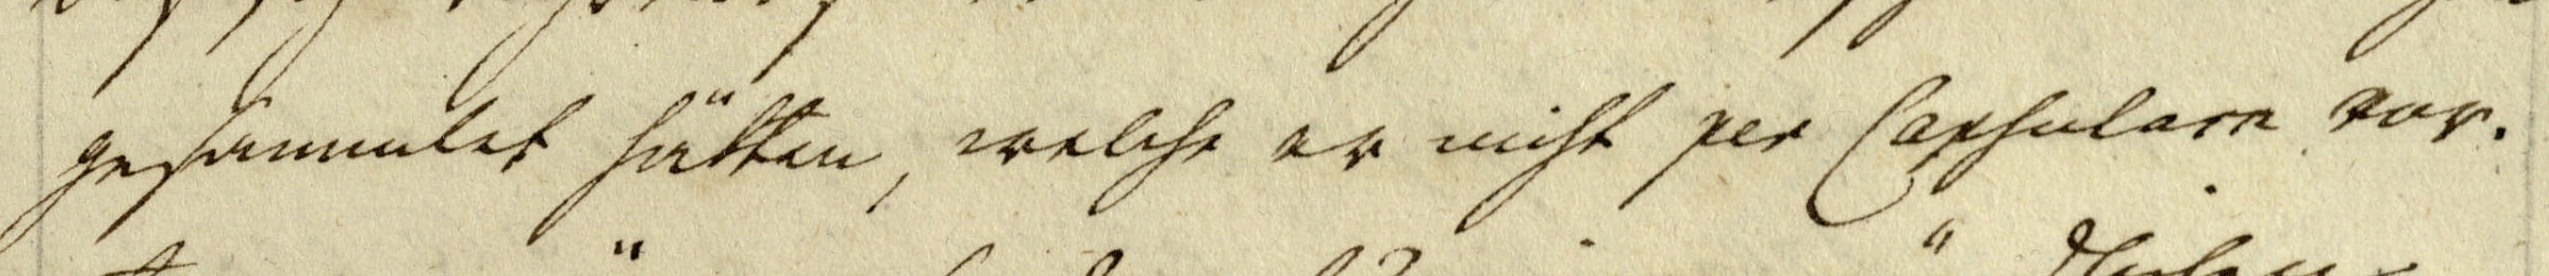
gesammlet hätten, welche er nicht per Capsulam vor
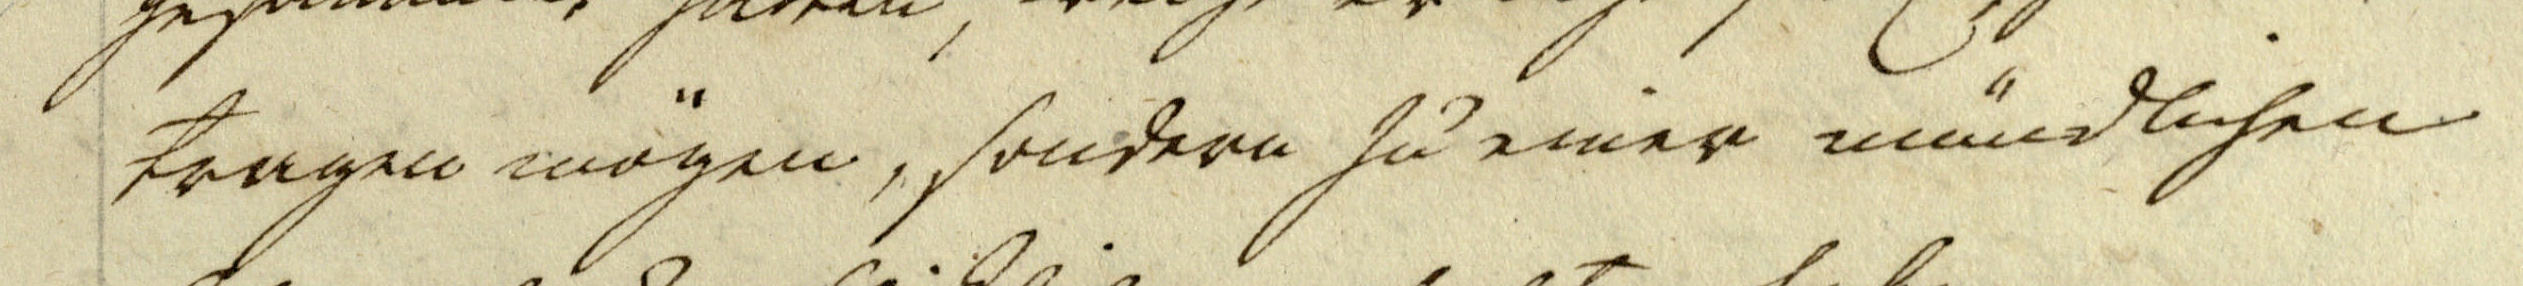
tragen mögen, sondern zu einer mündlichen
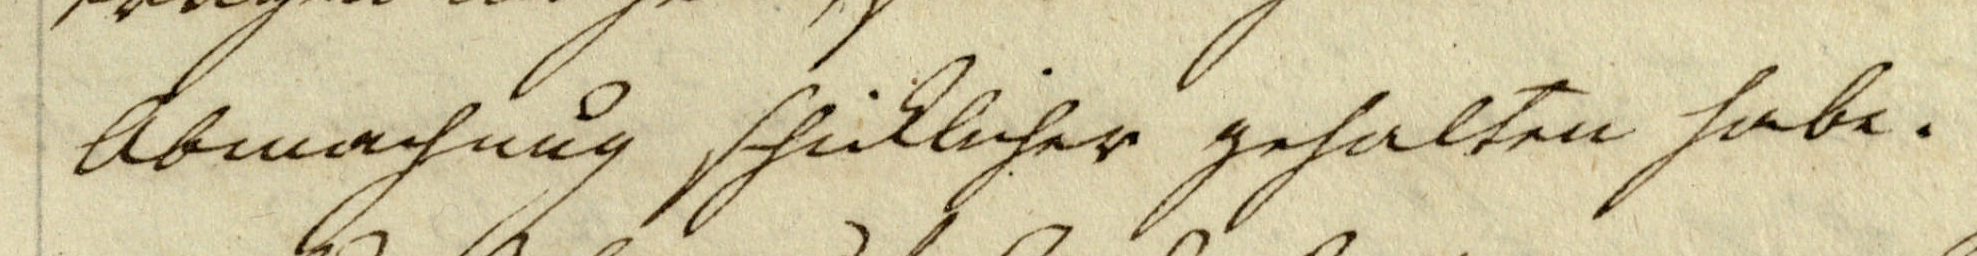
Abmachung schicklicher gehalten habe.
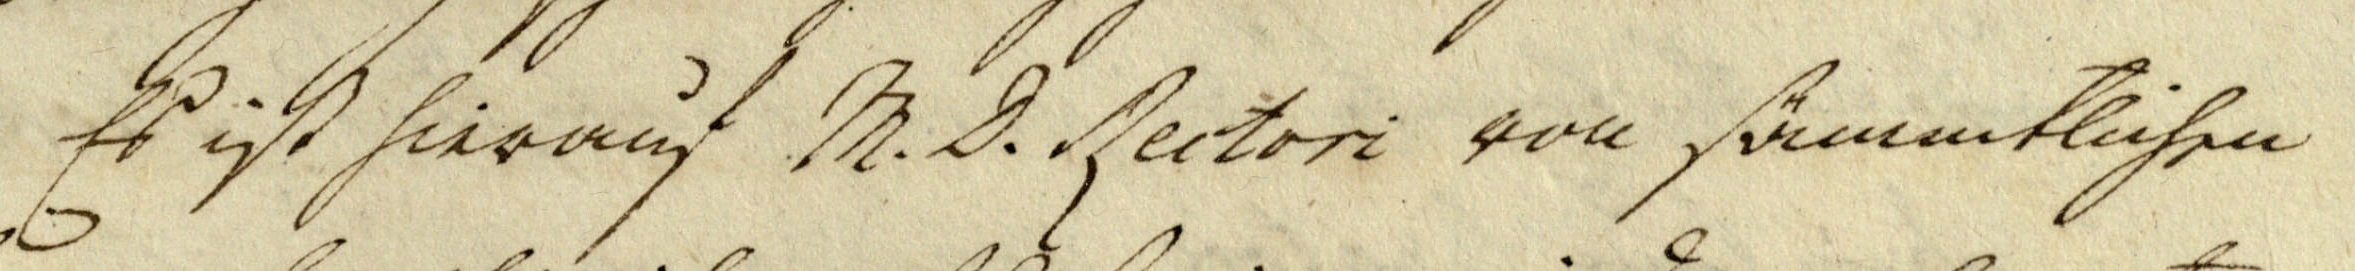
Es ist hierauf M. D. Rector von sämmtlichen
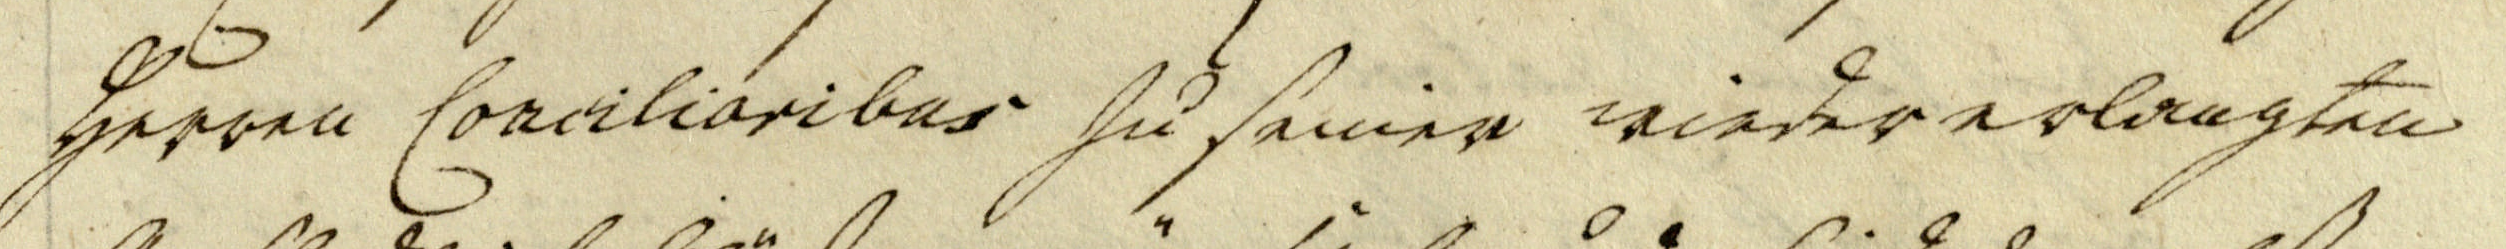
Herren Conciliaribus zu seiner wieder erlangten
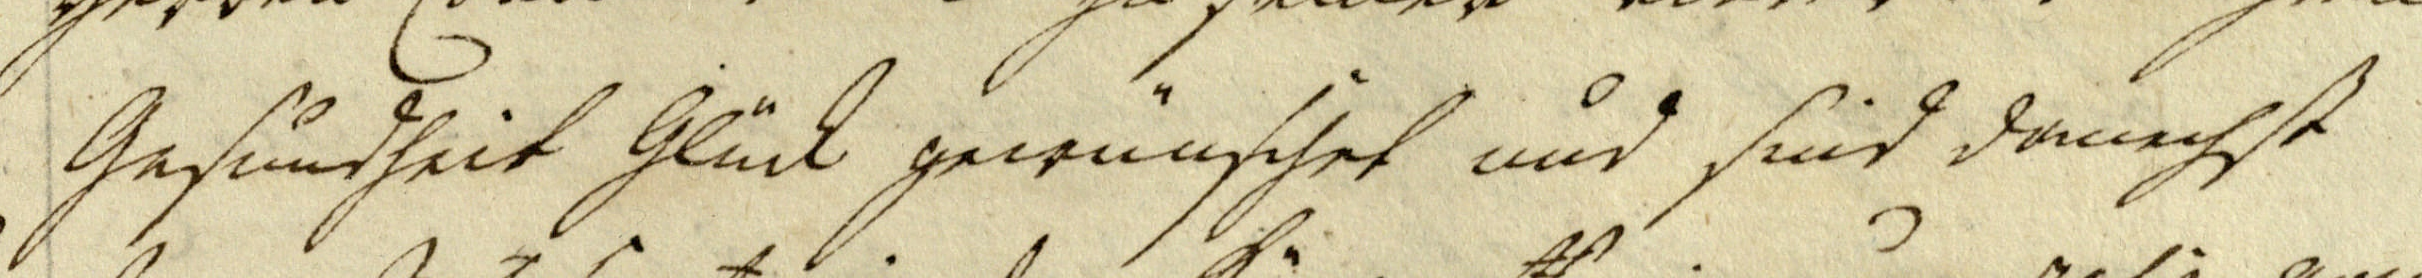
Gesundheit Glück gewünschet und sind danechst
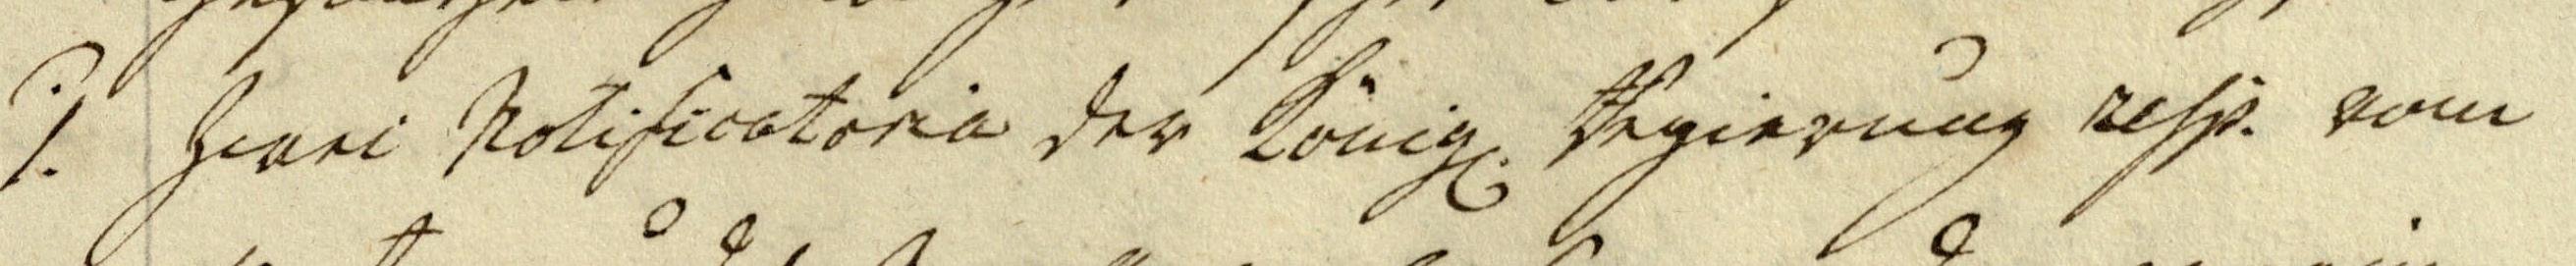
1. Zwei Notificotoria der Königl. Regierung resp. vom
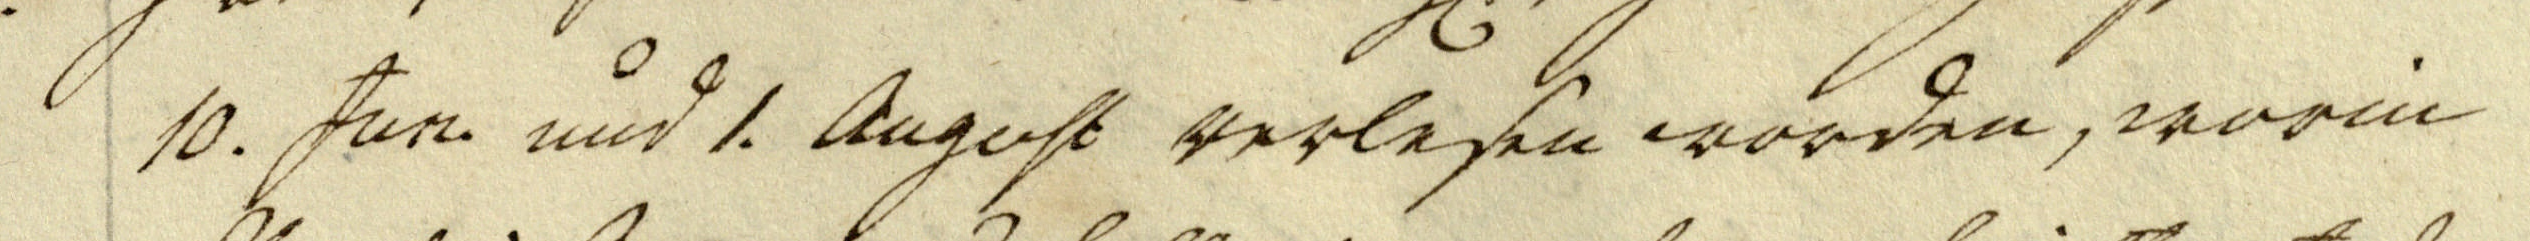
10. Jun. und 1. August verlesen worden, worin
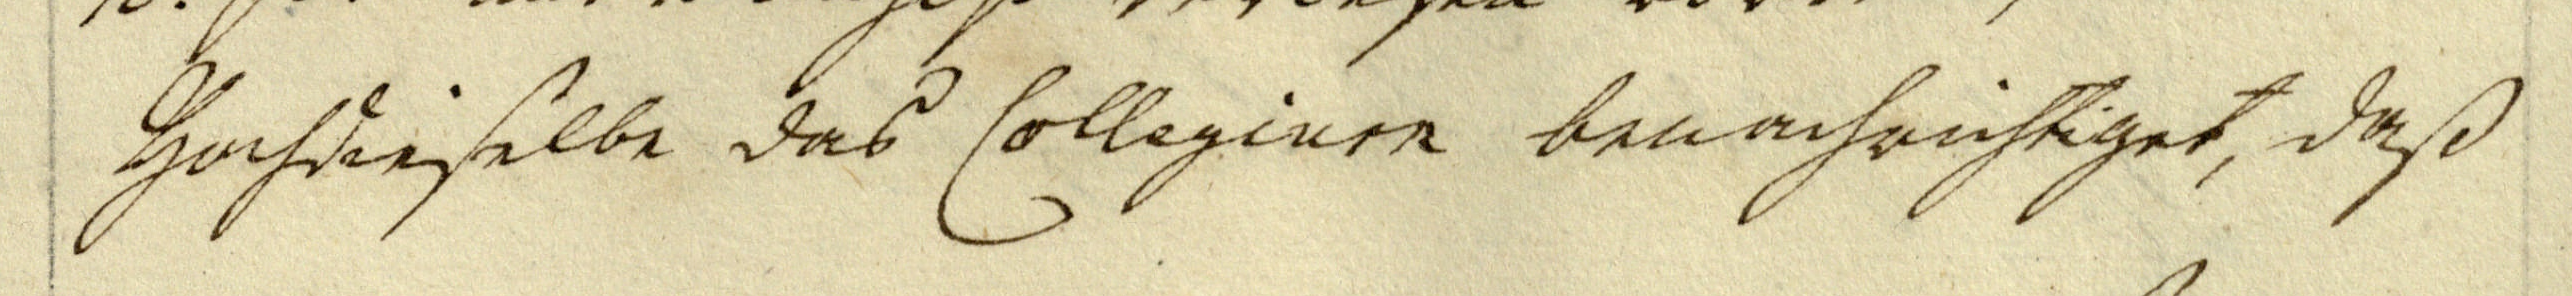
Hochdieselbe das Collegium benachrichtiget, daß
